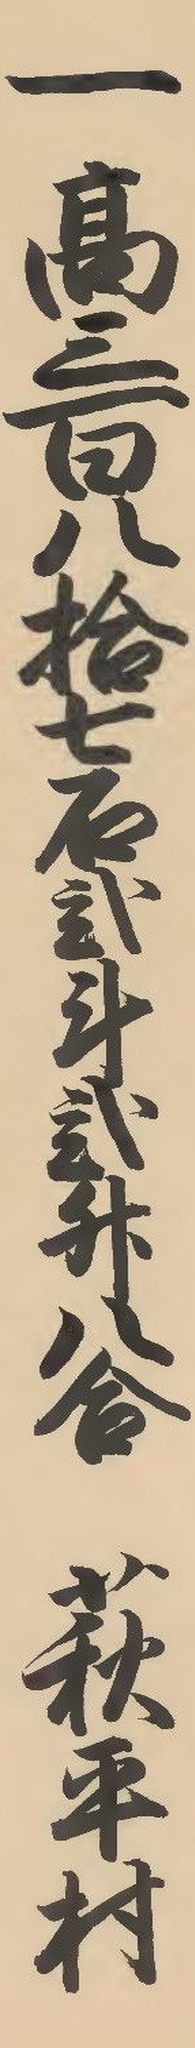一高三百八拾七石弐斗弐升八合萩平村
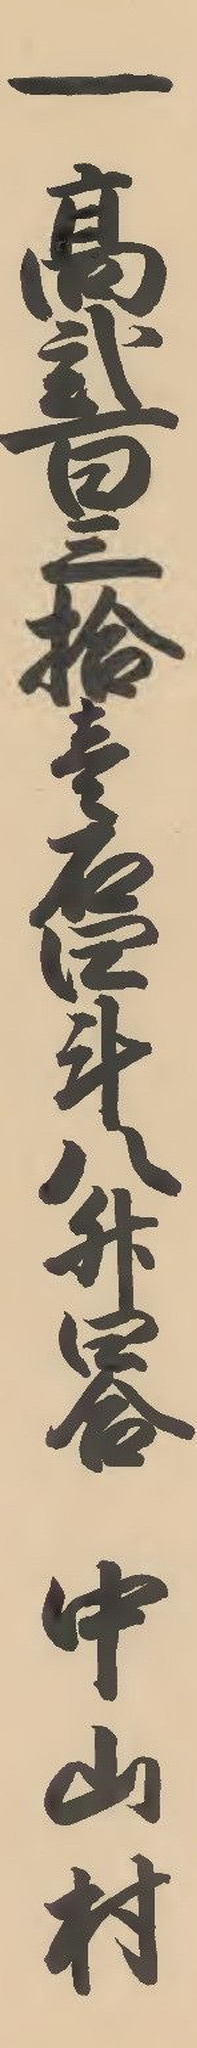一高弐百三拾壱石四斗八升四合中山村
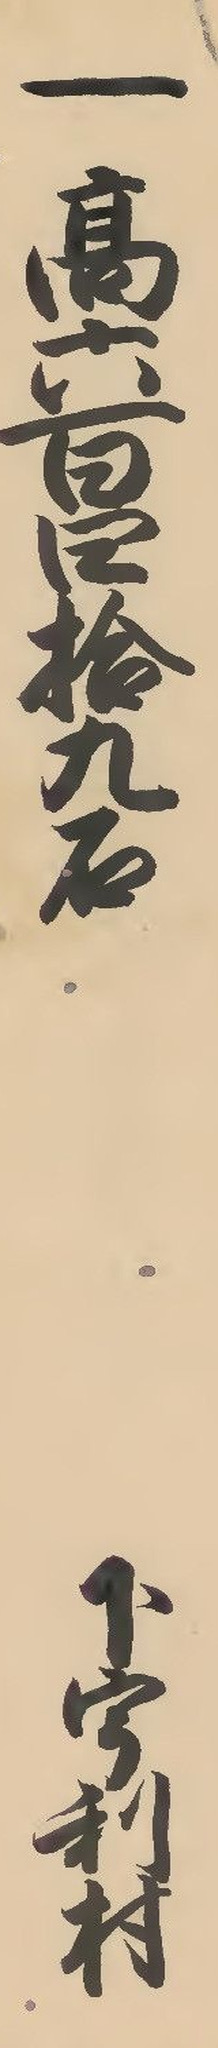一高六百四拾九石下宇利村

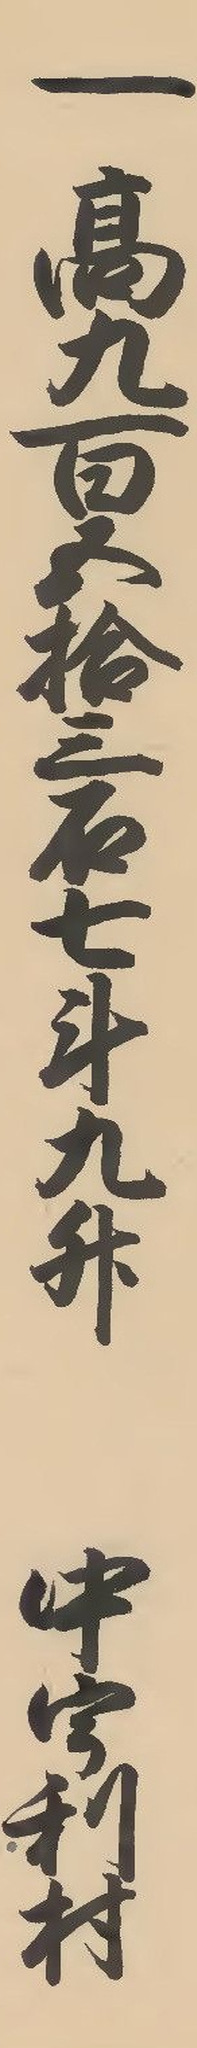一高九百五拾三石七斗九升中宇利村
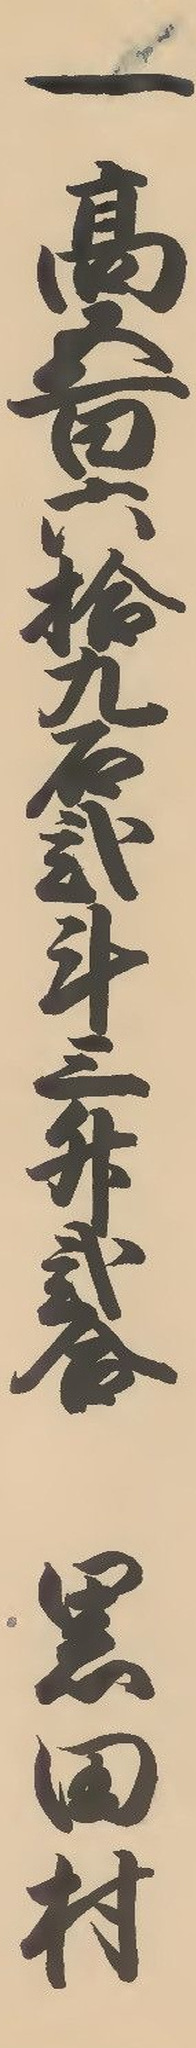一高五百六拾九石弐斗三升弐合黒田村
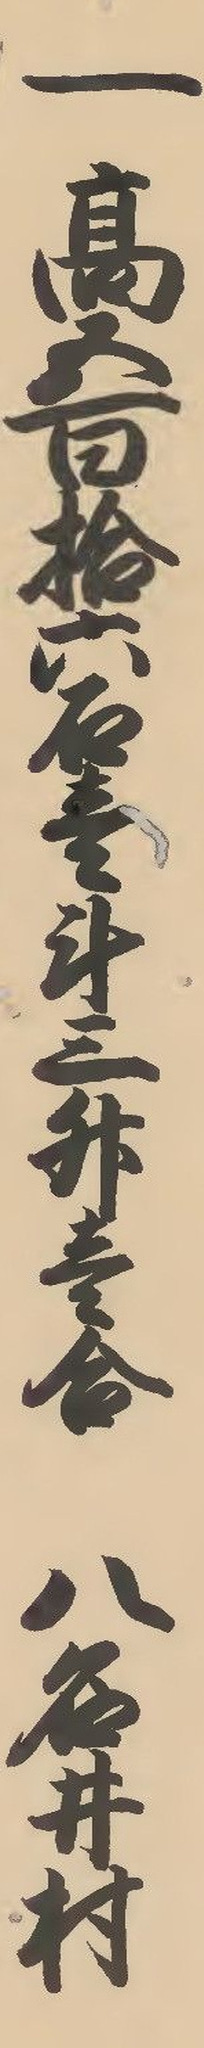一高五百拾六石壱斗三升壱合八名井村
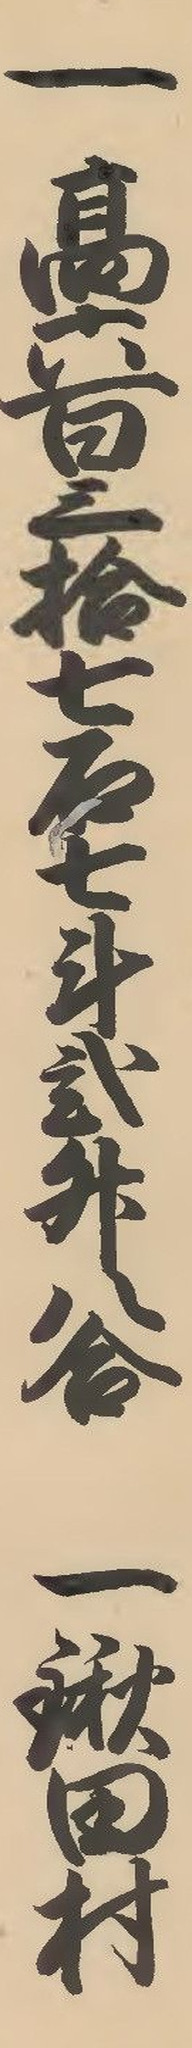一高六百三拾七石七斗弐升八合一鍬田村
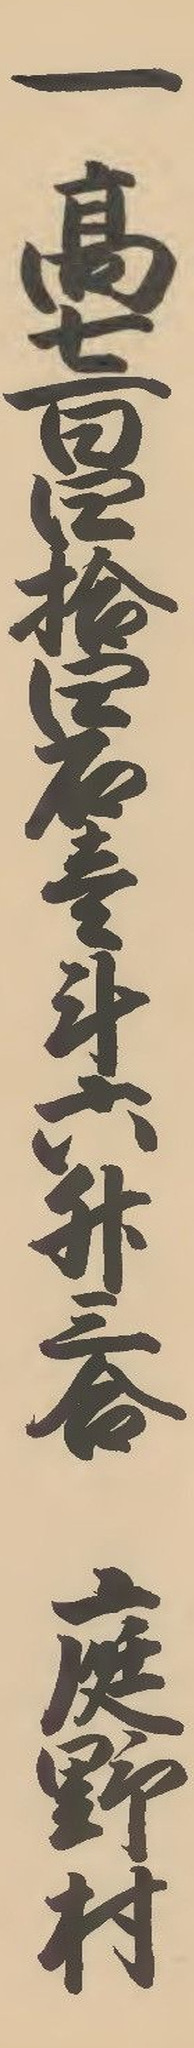一高七百四拾四石壱斗六升三合庭野村
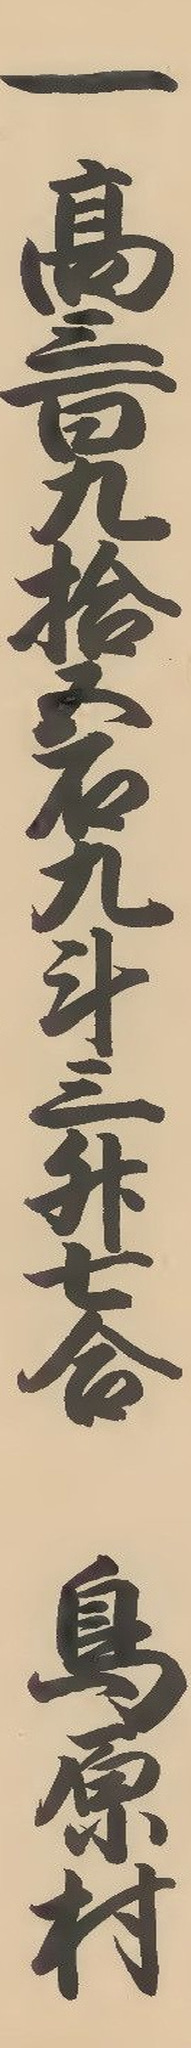一高三百九拾五石九斗三升七合鳥原村
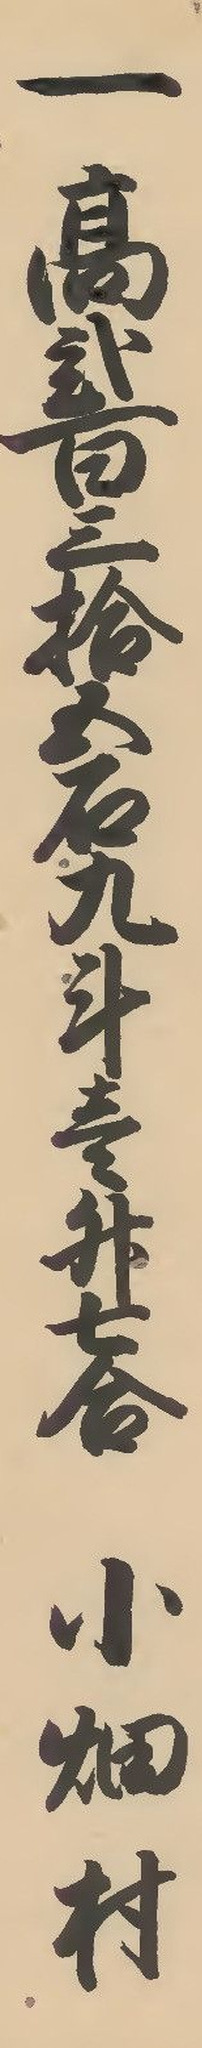一高弐百三拾五石九斗壱升七合小畑村

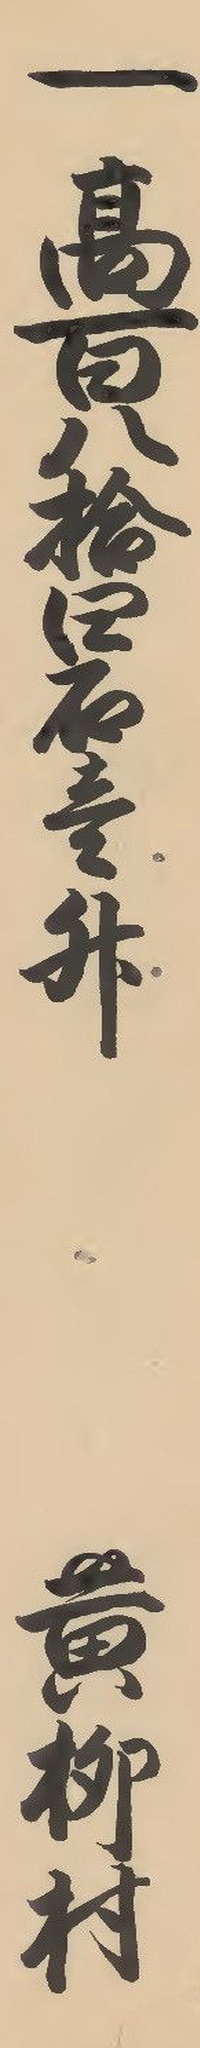一高百八拾四石壱升黄柳村
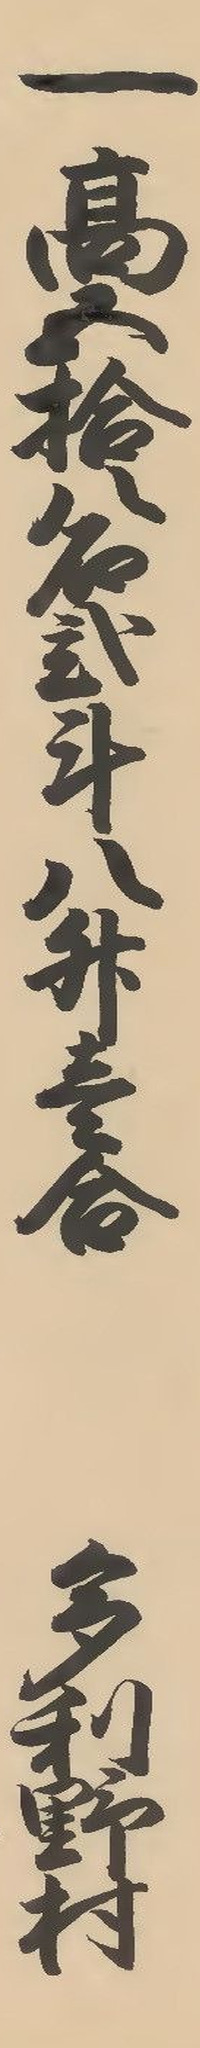一高五拾八石弐斗八升壱合多利野村
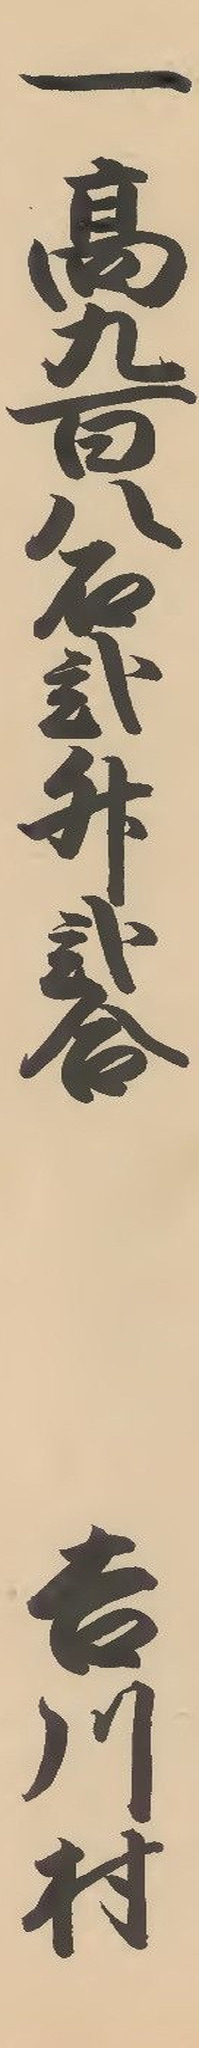一高九百八石弐升弐合吉川村
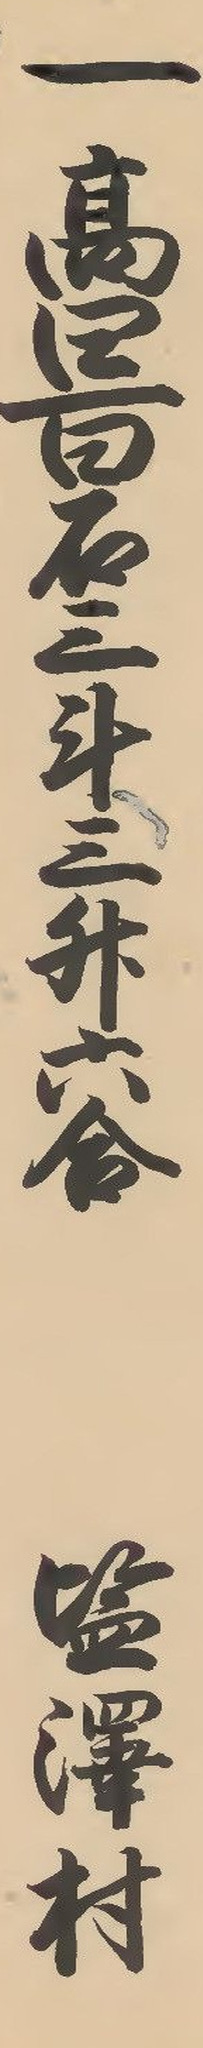一高四百石三斗三升六合塩沢村
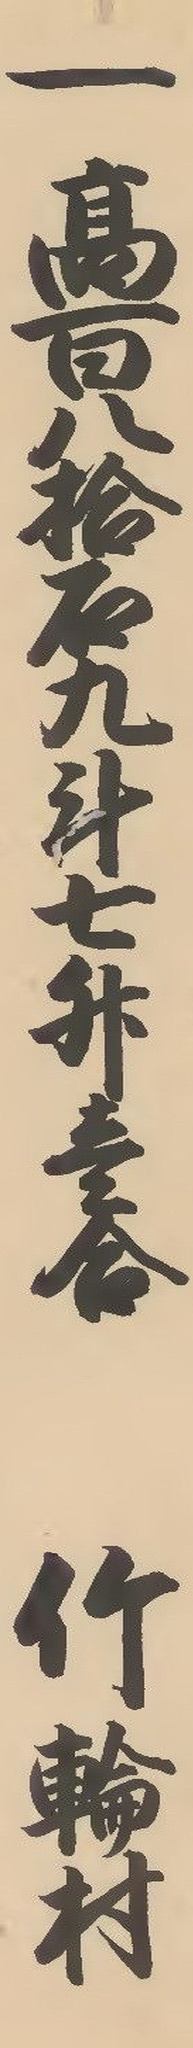一高百八拾石九斗七升壱合竹輪村
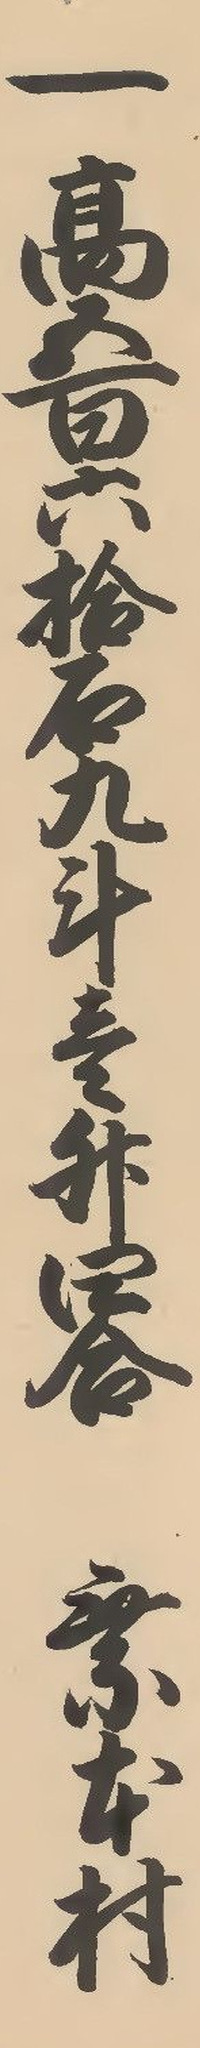一高五百六拾石九斗壱升四合乗本村
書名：三河国郷帳
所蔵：国立公文書館 National Archives of Japan
